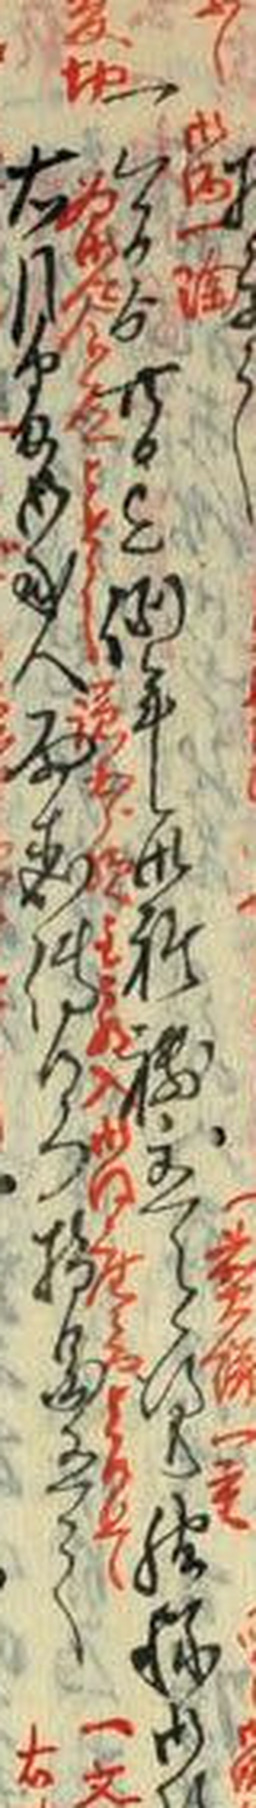右月番御用人雨森伝左衛門指図有之
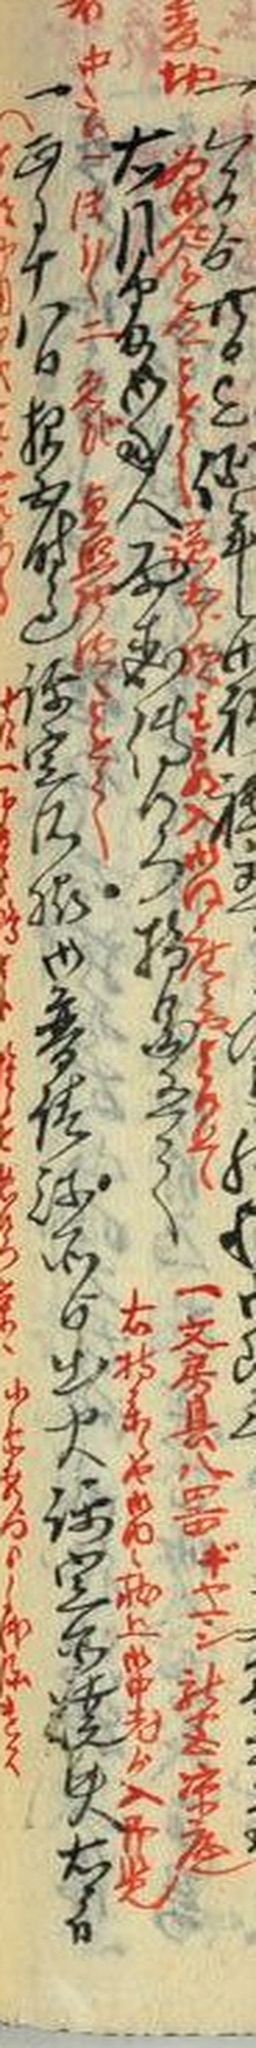一正月十八日夜五時過評定所脇御普請役所ゟ出火評定所焼失右ニ付
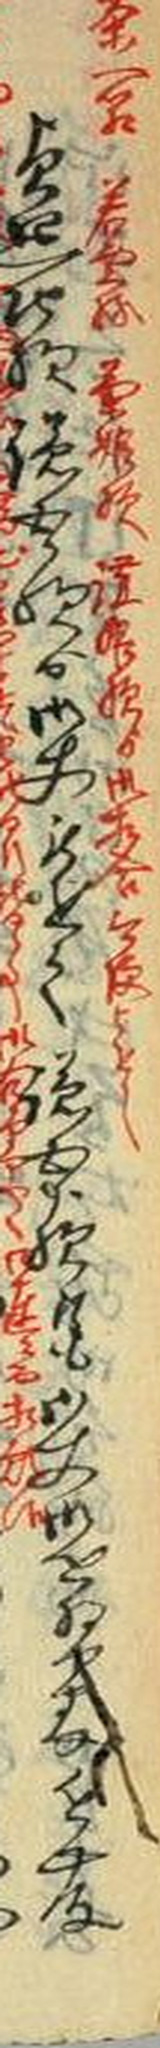貞照院様謙五郎様ゟ御使被進之謙五郎様江も御使御近習番近藤
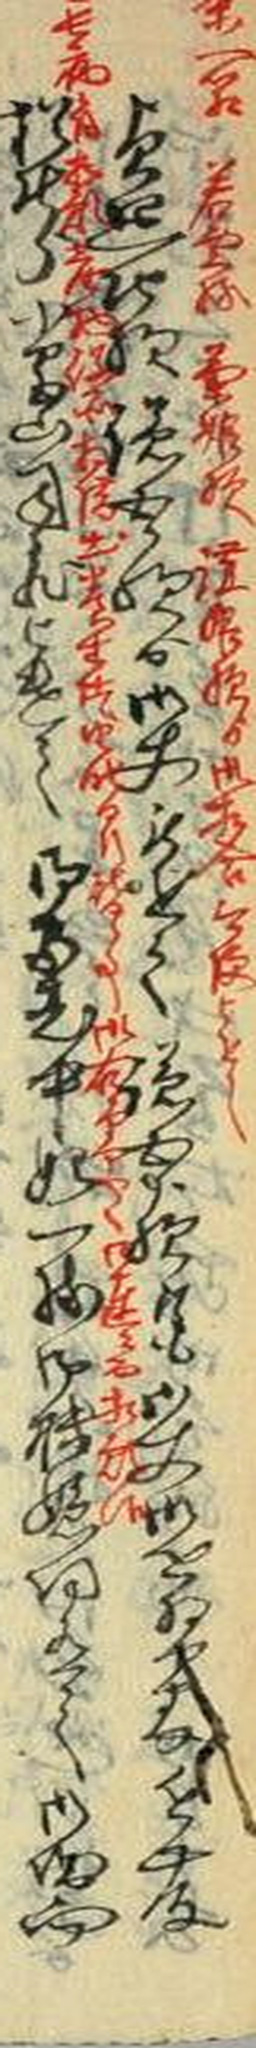猶次郎小宮山周蔵被遣之御家老中始一統御機嫌伺有之御側向
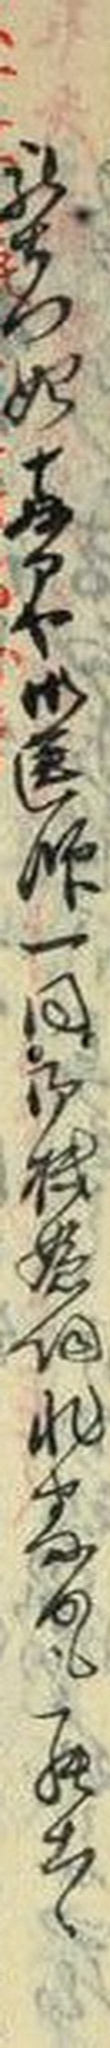新右衛門始両部や御医師一同御機嫌伺非番ゟも罷出候
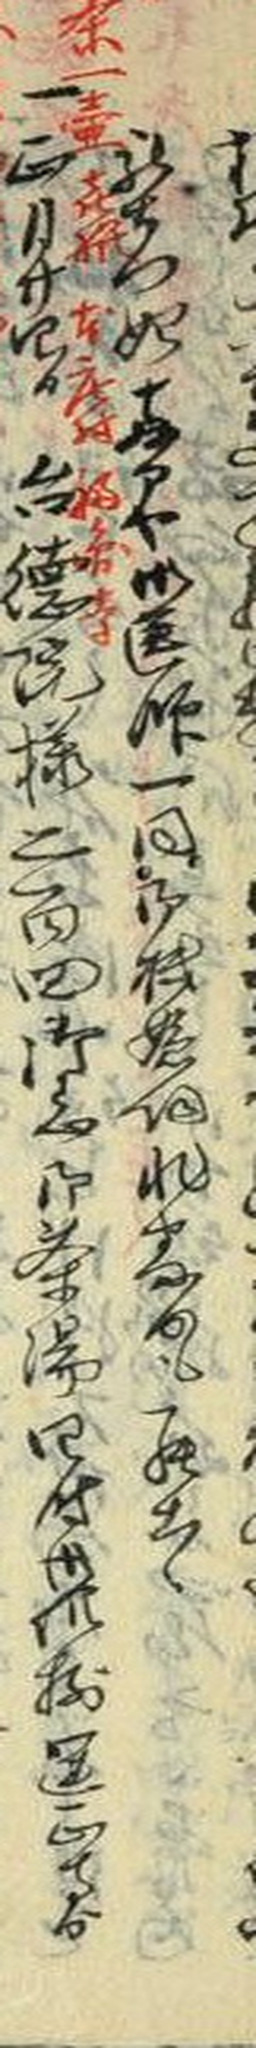一正月廿四日台徳院様二百回御忌御茶湯四時御供揃運正寺ゟ
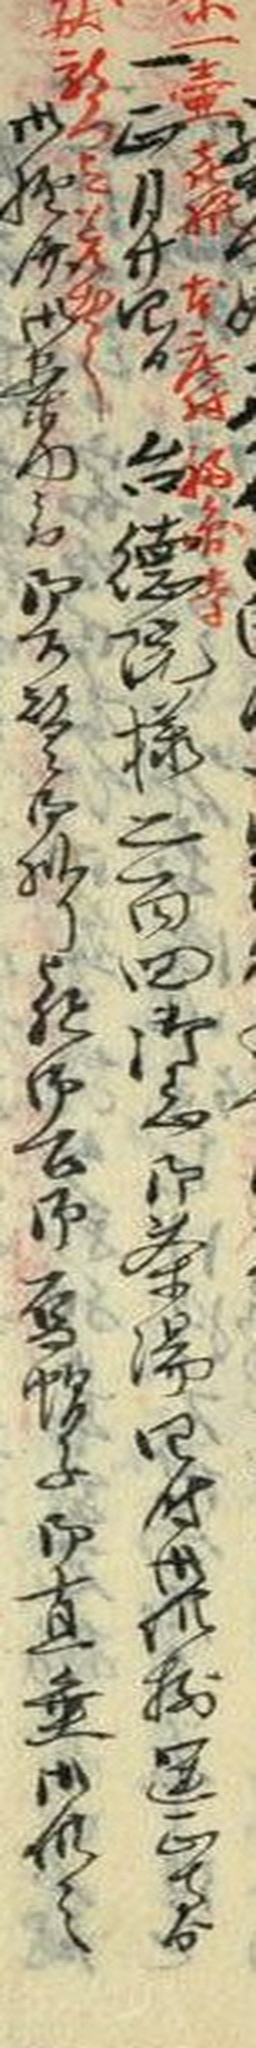御経済御案内ニ而御召替ニ御掛り被遊御召御烏帽子御直垂御供之
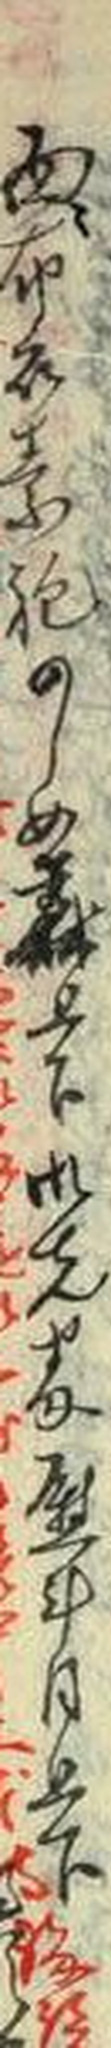面々布衣素袍のしめ麻上下御先番熨斗目上下
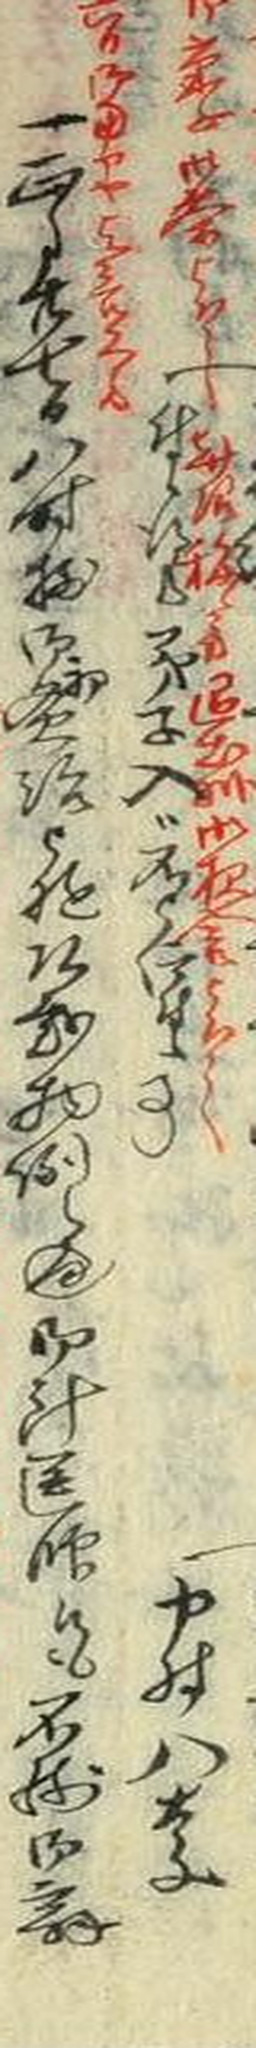一正月廿七日八時揃御初灸治被遊頂戴物例之通御針医師江も不残御扇
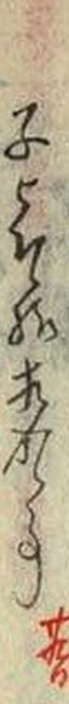子被下候様相成候事
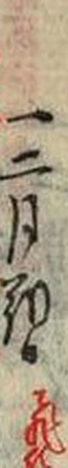一二月朔日
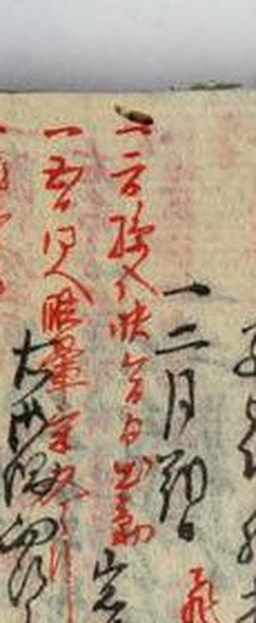一二日孫八快今日ゟ出勤
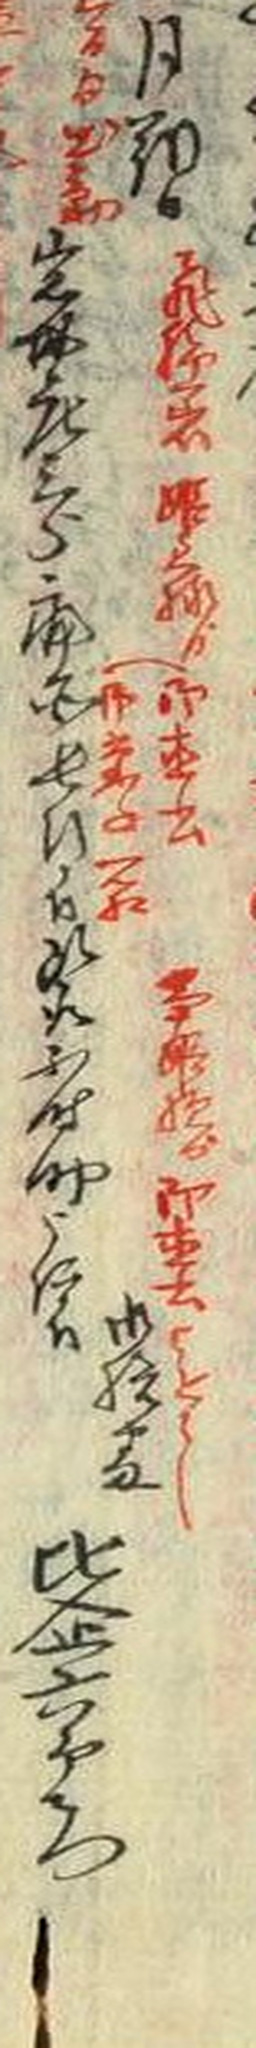岩城庄三郎痛処長引ニ付頭取不時助被仰付御膳番比企六郎右衛門
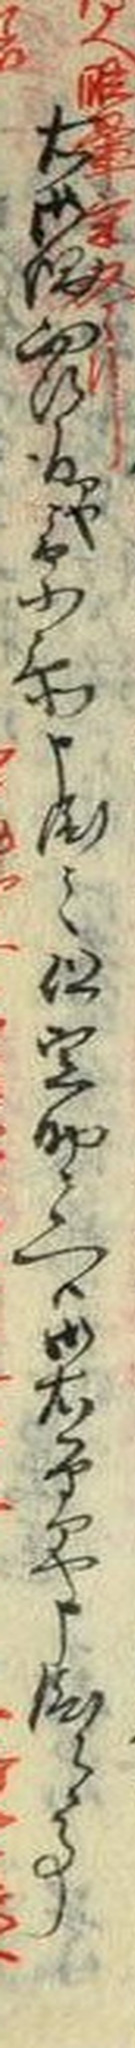右御側向頭取部やニ而小兵衛申渡之但定助ニ候ヘハ御右筆部や申渡之候事
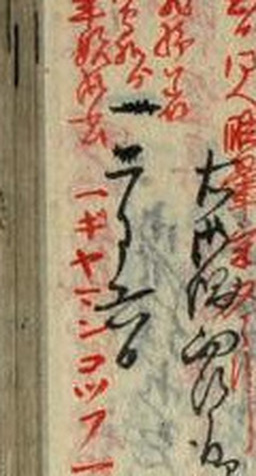一二月六日

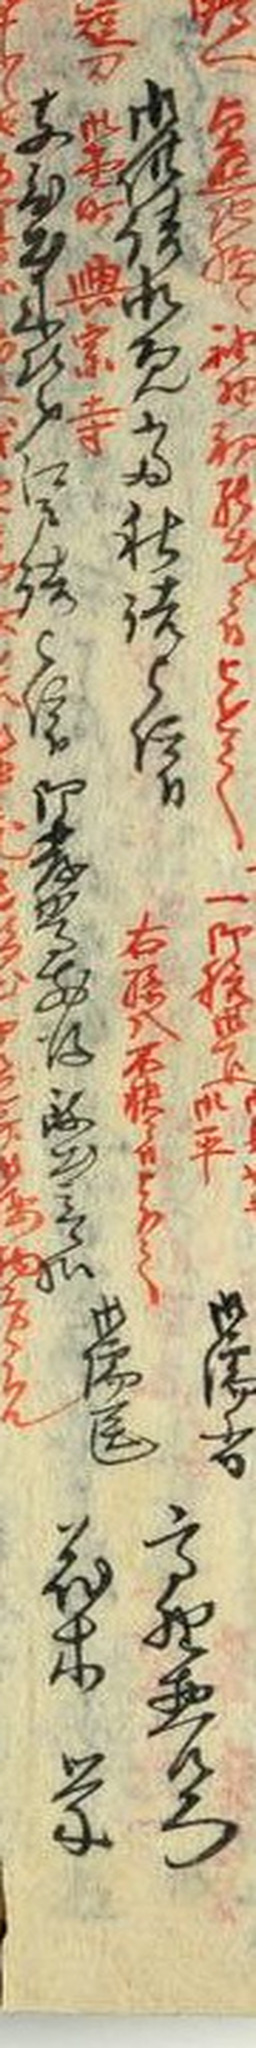支度出来次第江戸詰被仰付御発駕前後致出立候様御儒医花木栄
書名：少傅日録抄（斉承付側向頭取日記、在国）
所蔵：福井県文書館 Fukui Prefectural Archives
